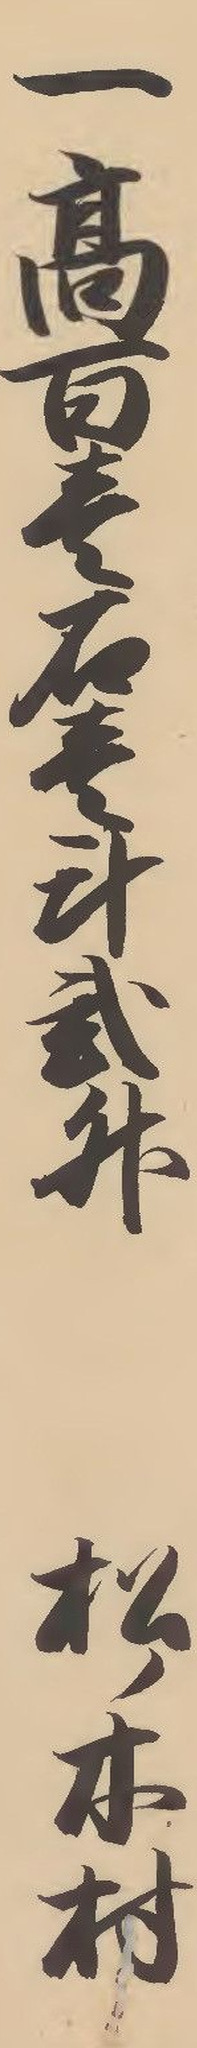一高百壱石壱斗弐升松ノ木村
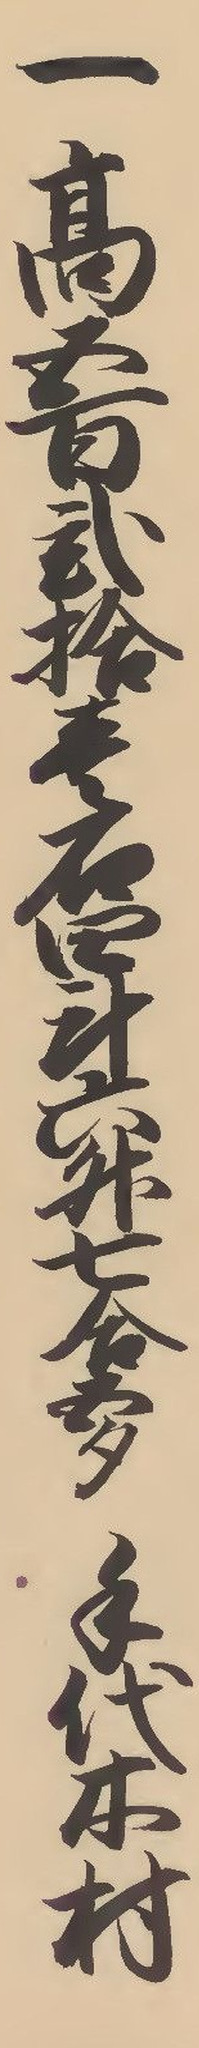一高五百弐拾壱石四斗六升七合五勺手代木村

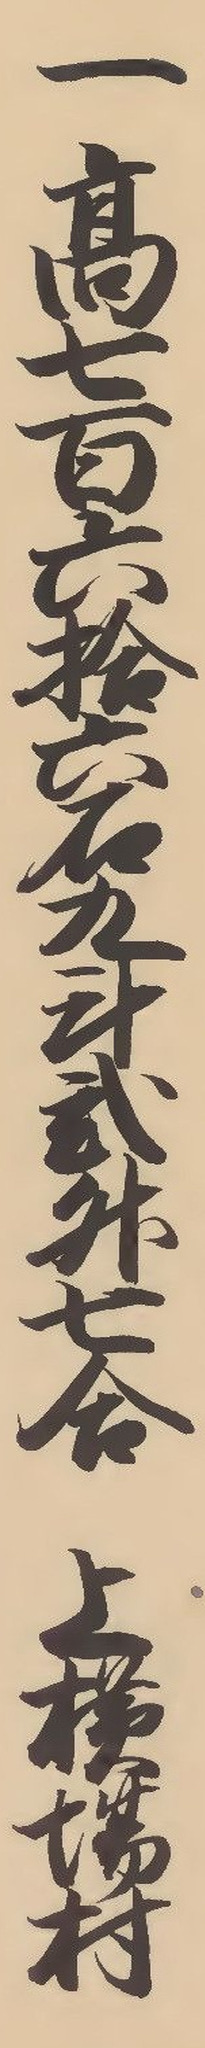一高七百六拾六石九斗弐升七合上横場村
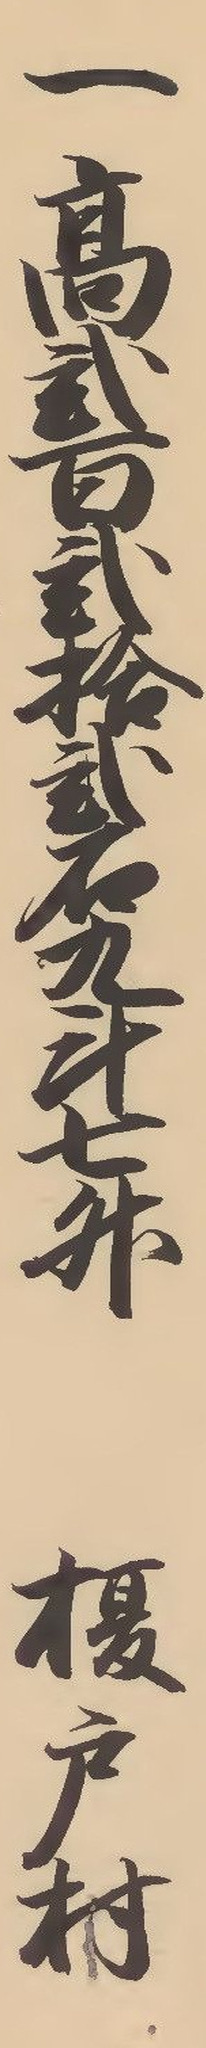一高弐百弐拾弐石九斗七升榎戸村
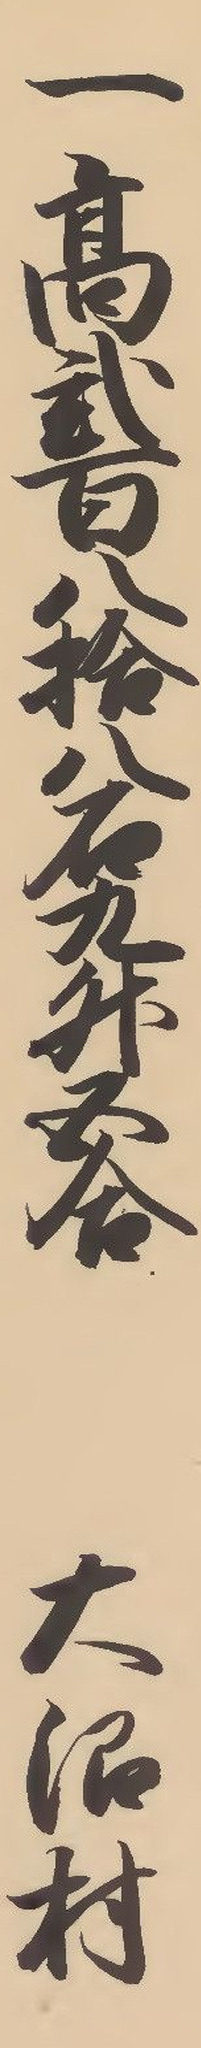一高弐百八拾八石九升五合大沼村
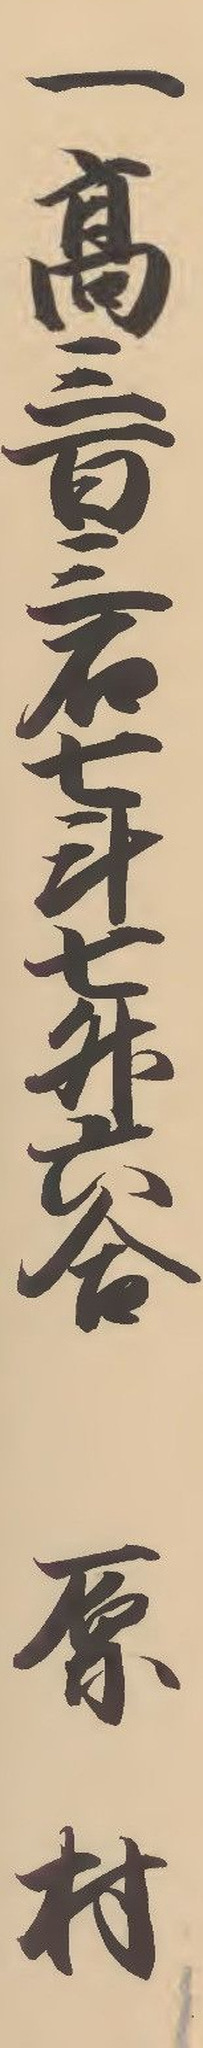一高三百三石七斗七升六合原村
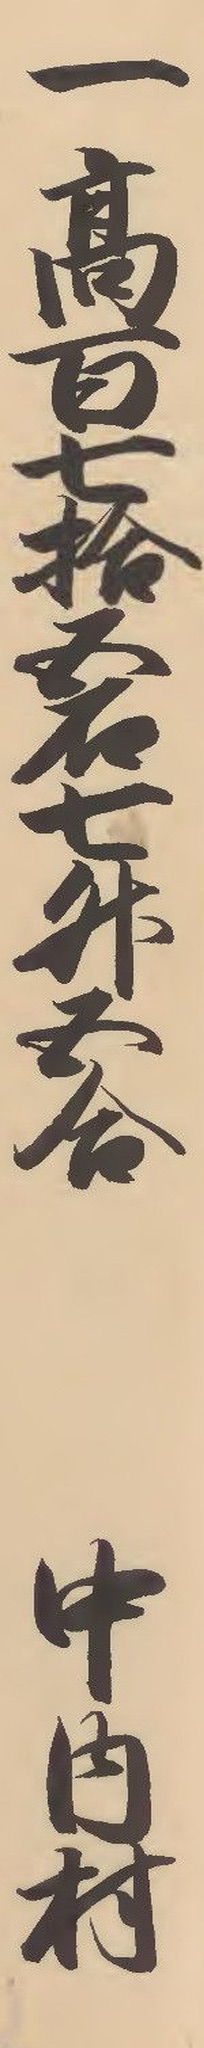一高百七拾五石七升五合中内村
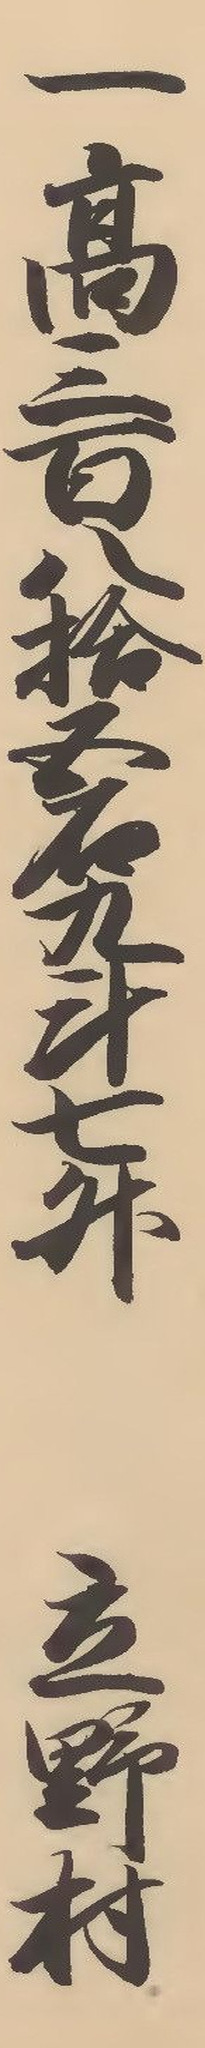一高三百八拾五石九斗七升立野村
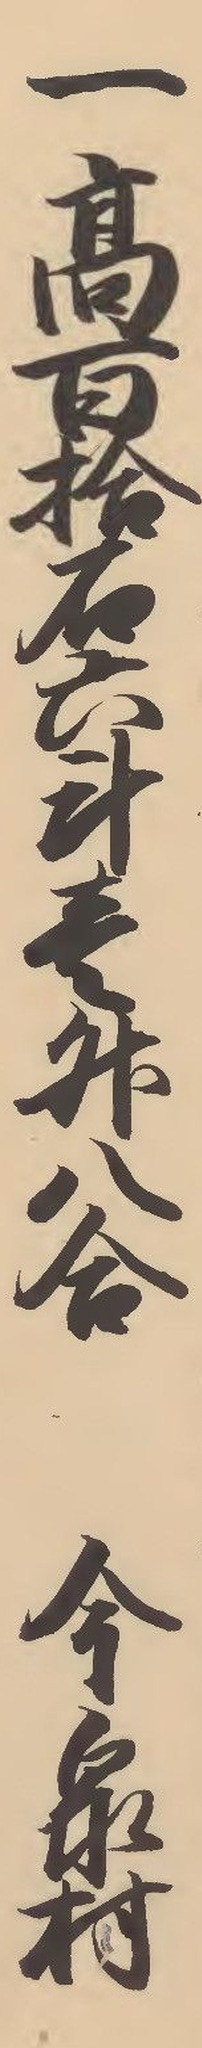一高百拾石六斗壱升八合今泉村
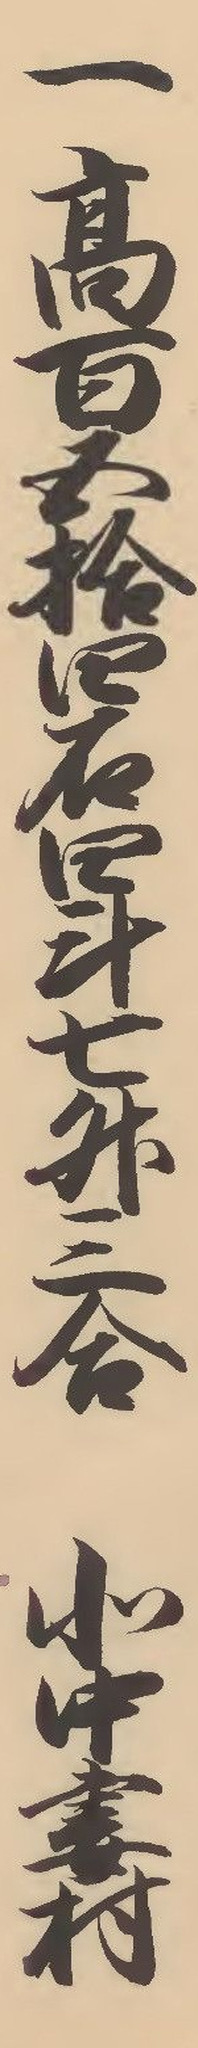一高百五拾四石四斗七升三合北中妻村

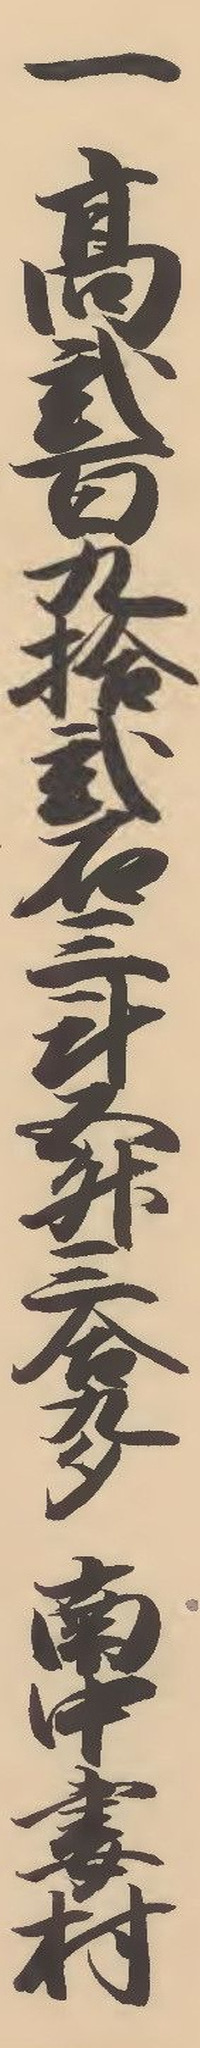一高弐百九拾弐石三斗五升三合九勺南中妻村
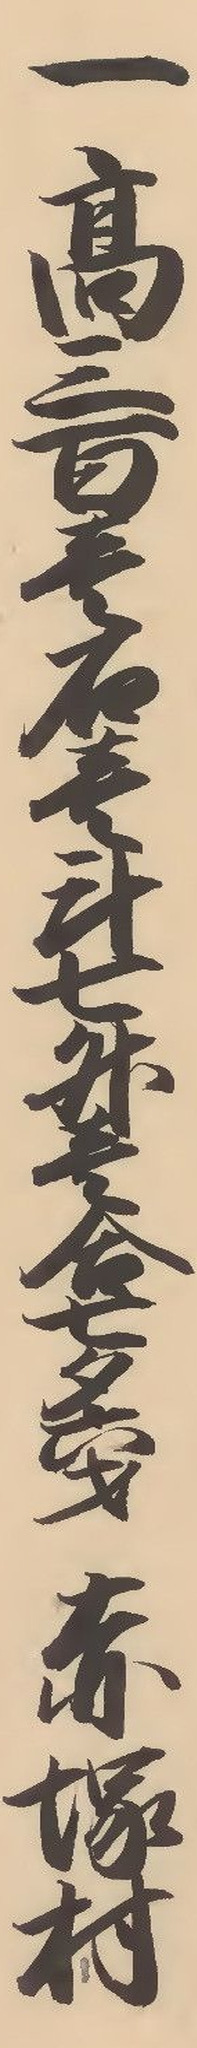一高三百壱石壱斗七升壱合七勺六才赤塚村
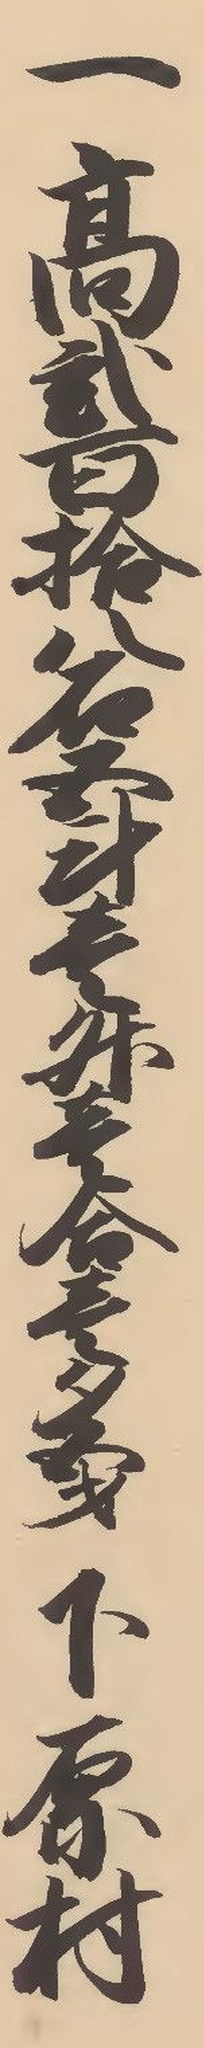一高弐百拾八石五斗壱升壱合壱勺五才下原村
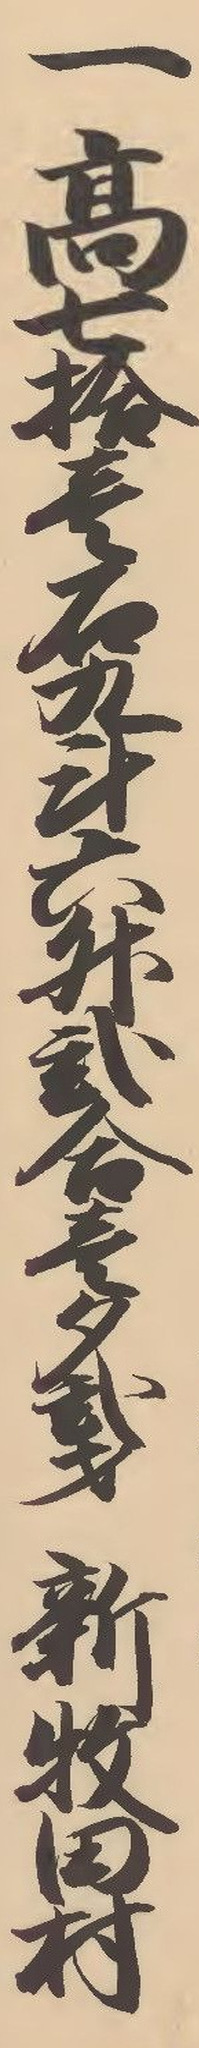一高七拾壱石九斗六升弐合壱勺弐才新牧田村
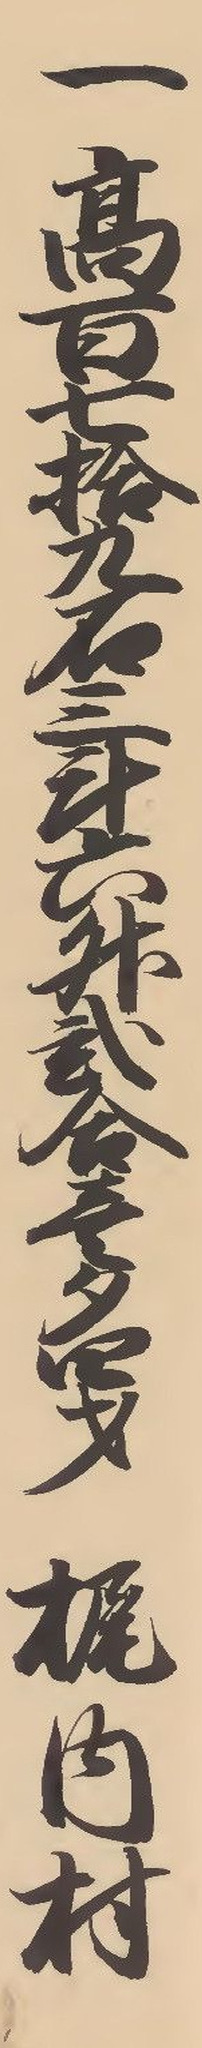一高百七拾九石三斗六升弐合壱勺四才梶内村
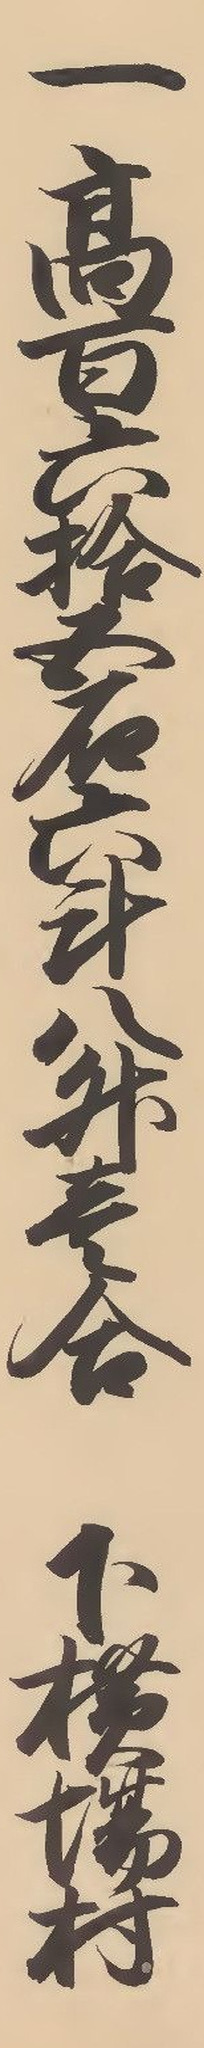一高百六拾五石六斗八升壱合下横場村
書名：常陸国郷帳
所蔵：国立公文書館 National Archives of Japan
